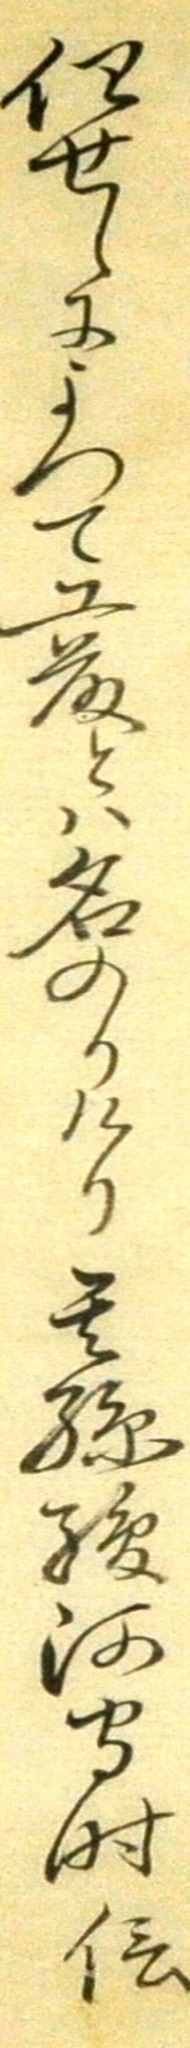任せしによつて工藤とは名のりけり其孫駿河守時信
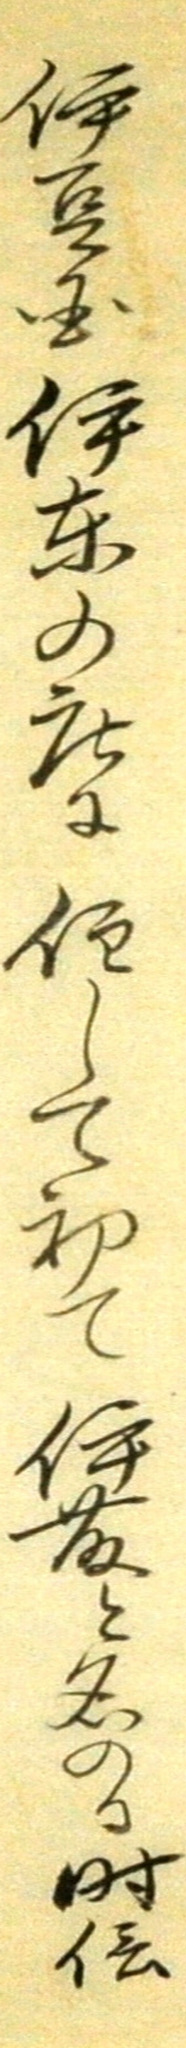伊豆国伊東の庄に住して初て伊藤と名のる時信
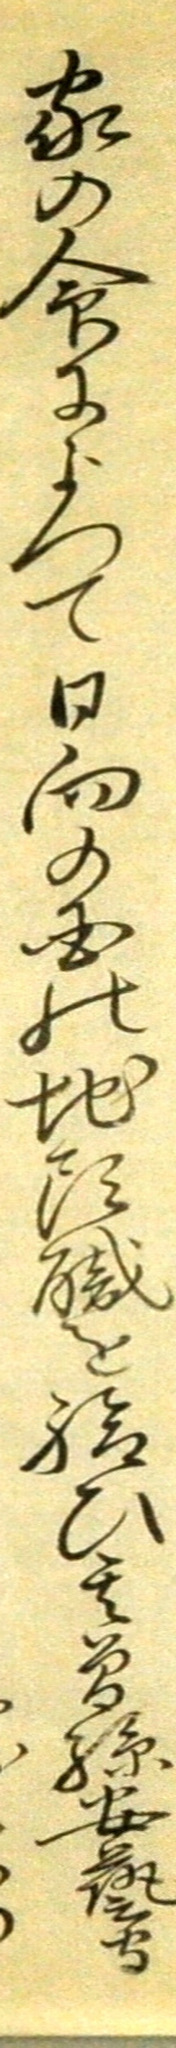家の命によつて日向の国の地頭職を給ひ其曽孫安芸守

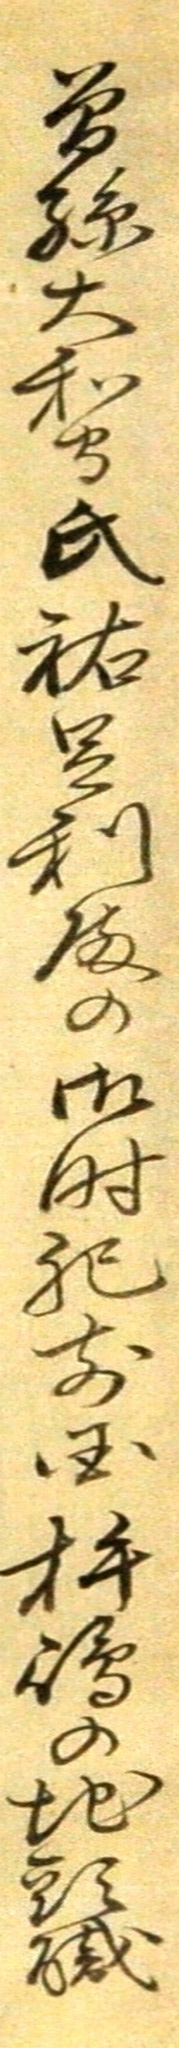曽孫大和守氏祐足利殿の御時肥前国杵島の地頭職
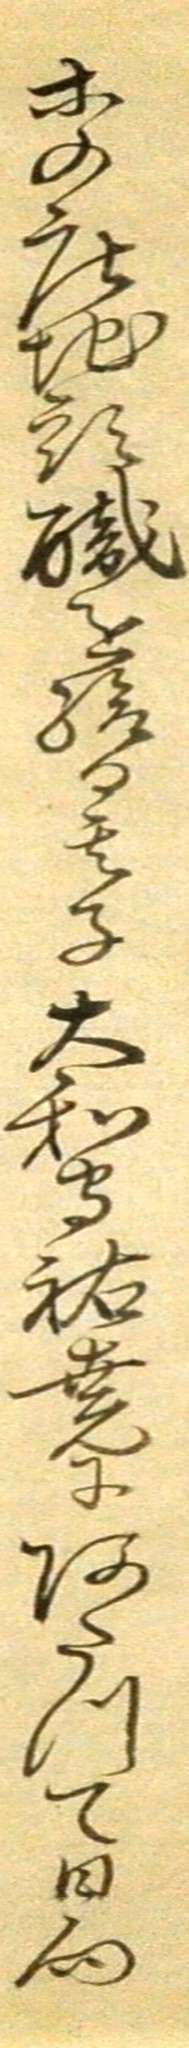等の庄地頭職を給る其子大和守祐堯にあたつて日向
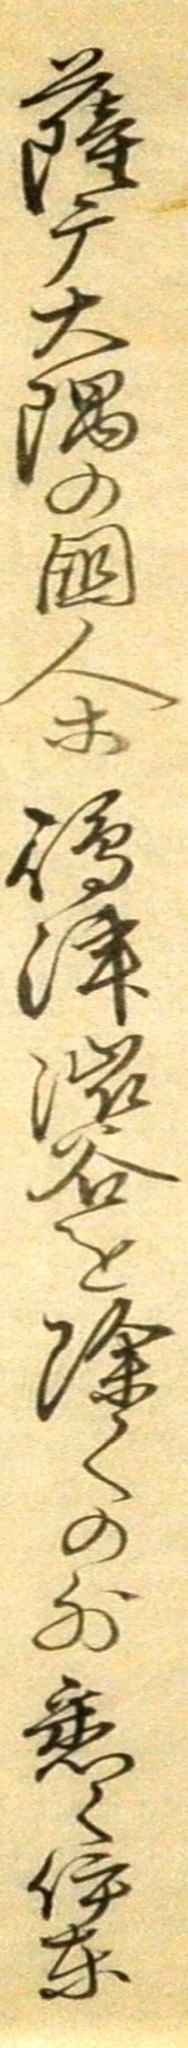薩摩大隅の国人等島津渋谷を除くの外悉く伊東
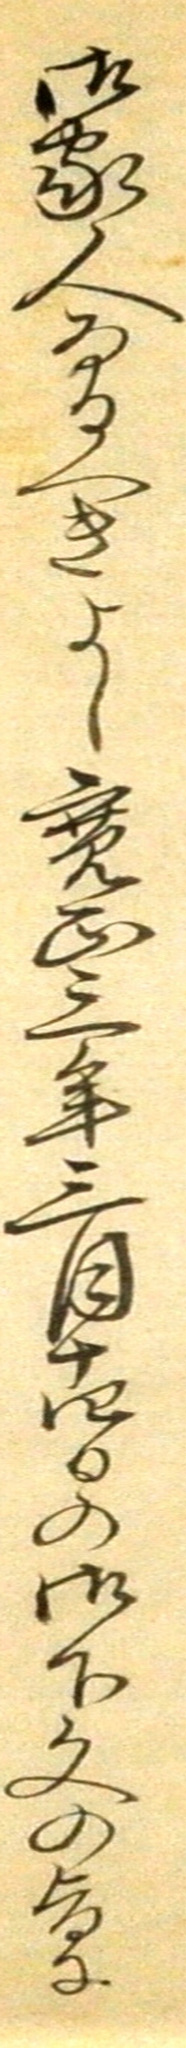御家人なるへきよし寛正三年三月十四日の御下文の旨に
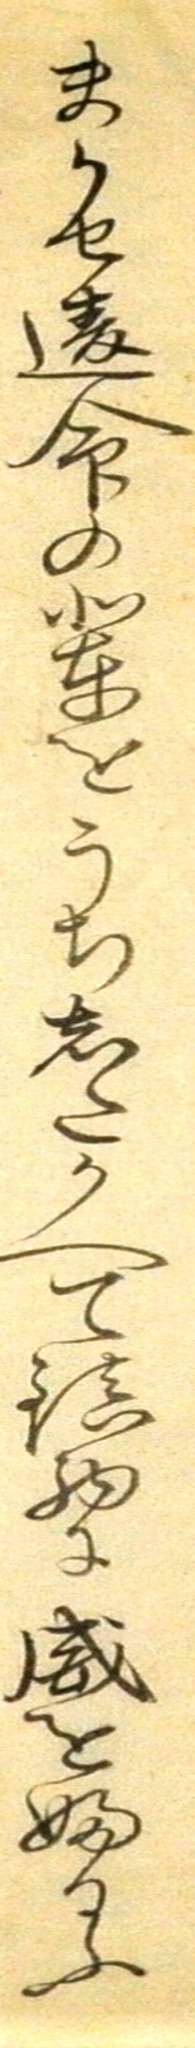まかせ違命の輩うちしたかへて鎮西に威をふるふ
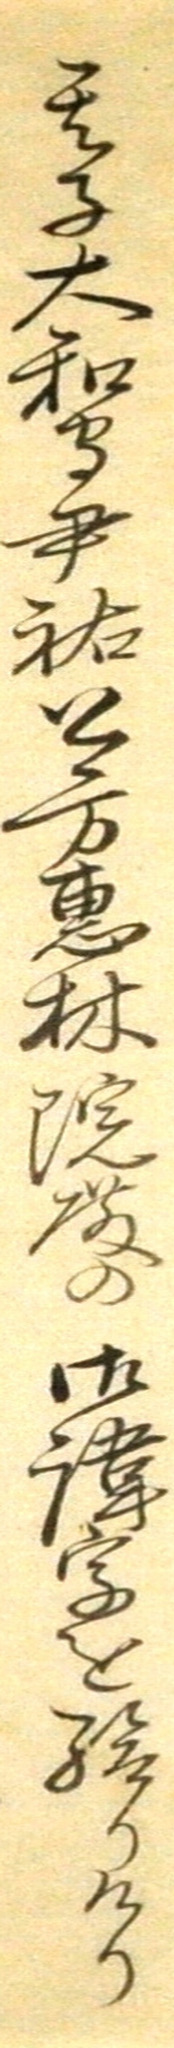其子大和守尹祐公方恵林院殿の御諱字を給りけり

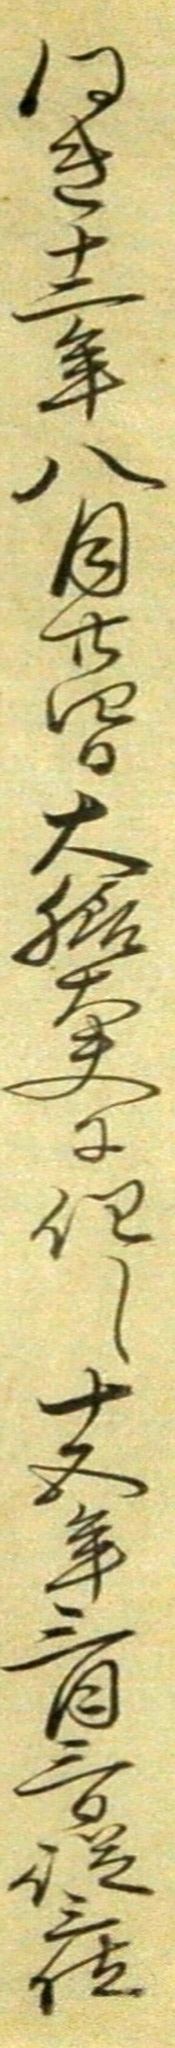同き十二年八月廿四日大膳大夫に任し十五年三月三日従三位
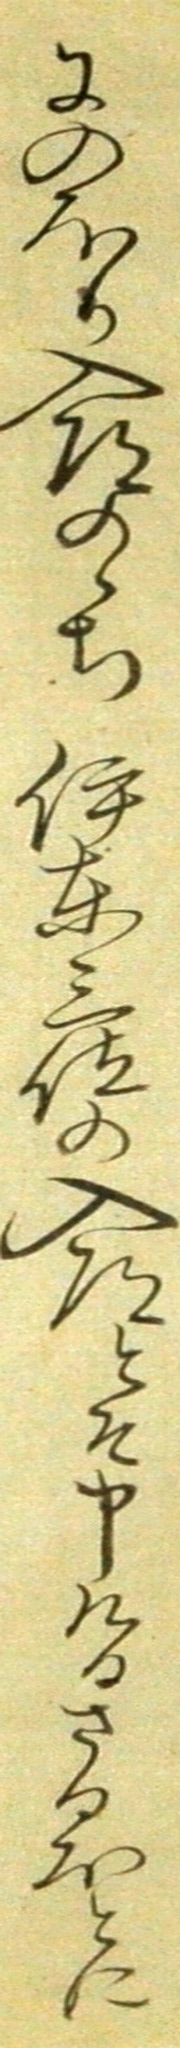にのほり入道のゝち伊東三位の入道とそ申けるさるほとに
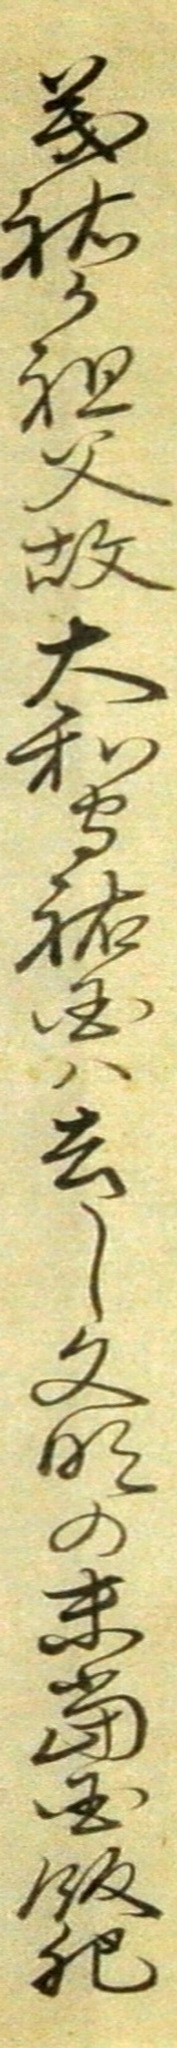義祐か祖父故大和守祐国は去し文明の末当国飫肥
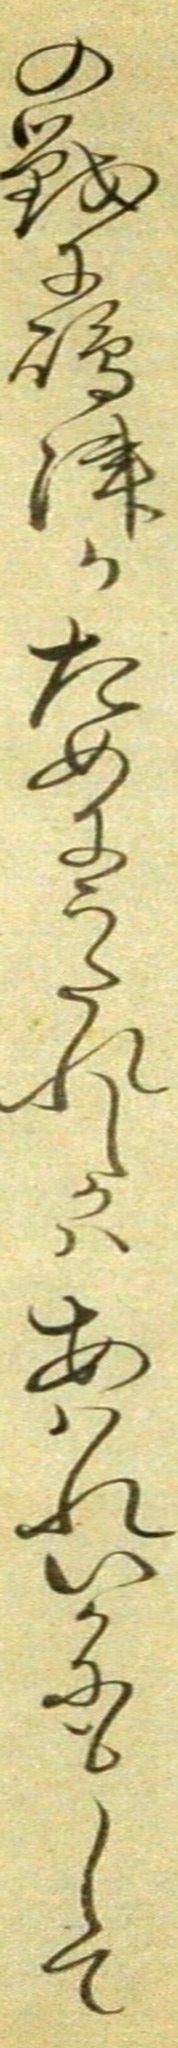の戦に島津かためにうたれしかはあはれいかにもして
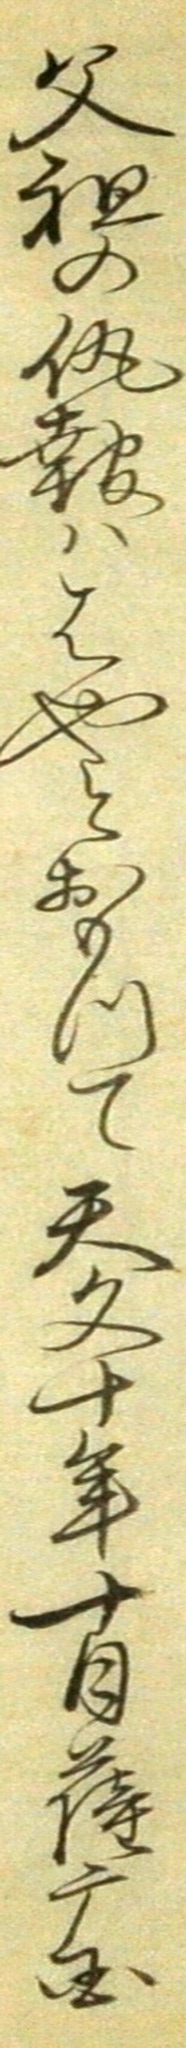父祖の仇報ははやとおもつて天文十年十月薩摩国
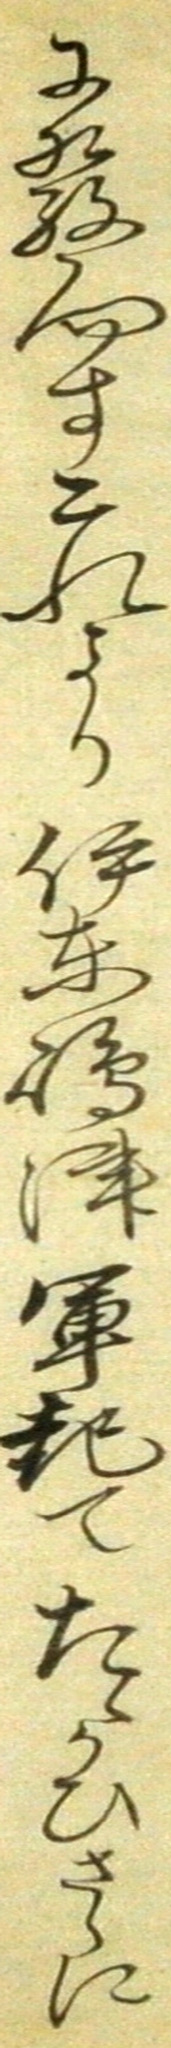に発向すこれより伊東島津軍起てたゝかひさらに
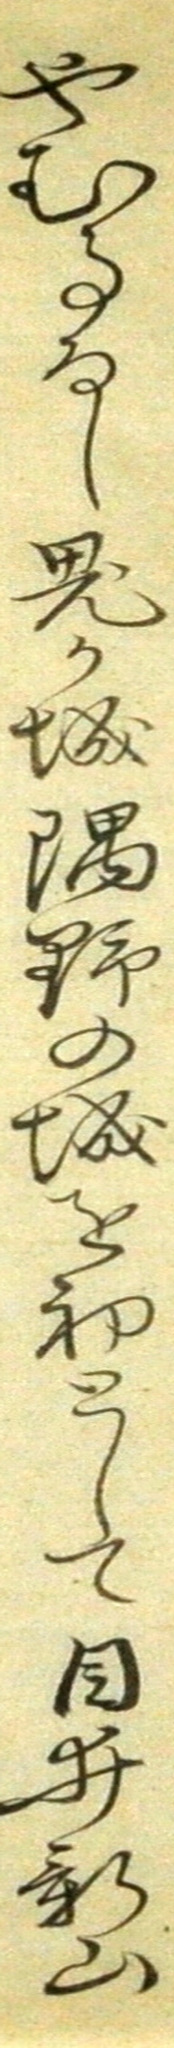やむ事なし鬼か城隅野の城を初として目井新山
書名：藩翰譜（九・下）
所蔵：伊那市立高遠町図書館・合同会社AMANE
